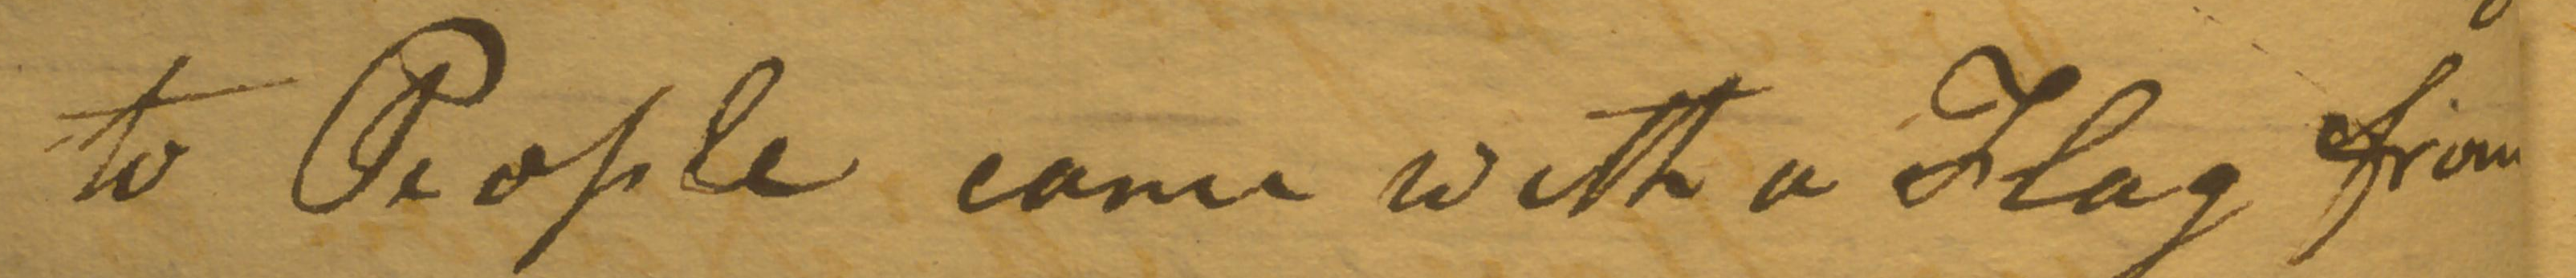to People came with a Flag from
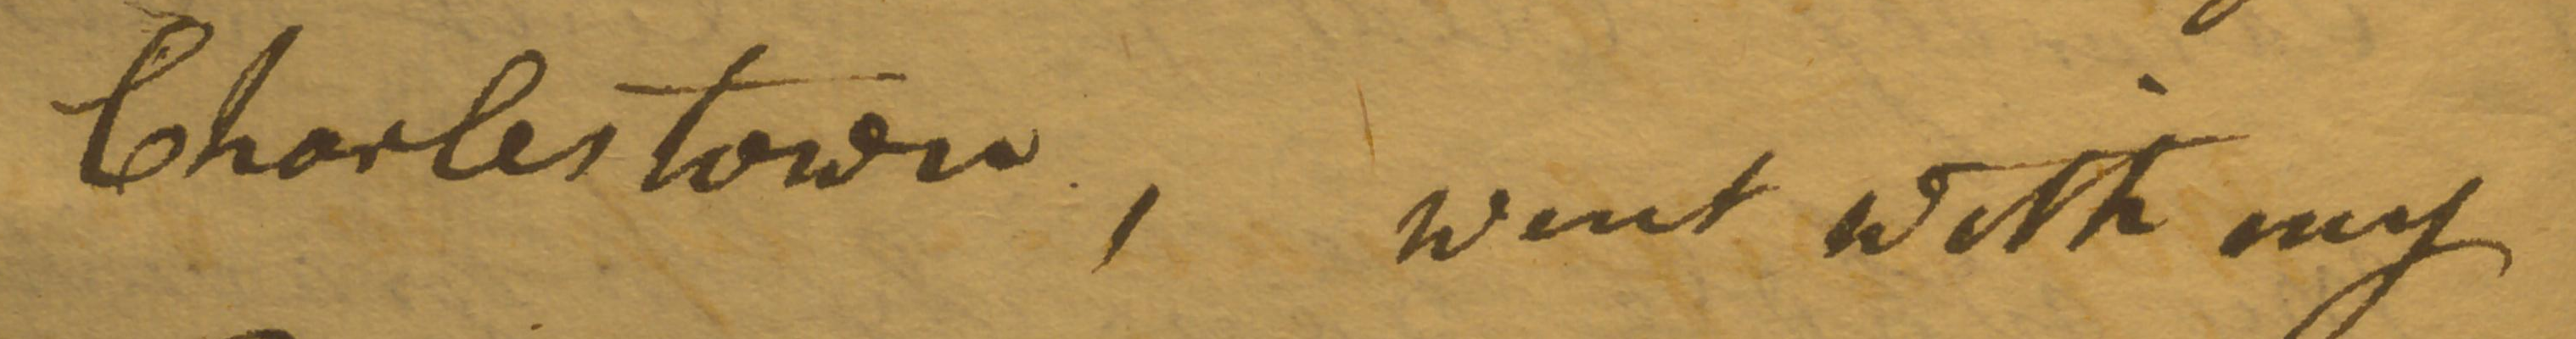Charlestown, went with my
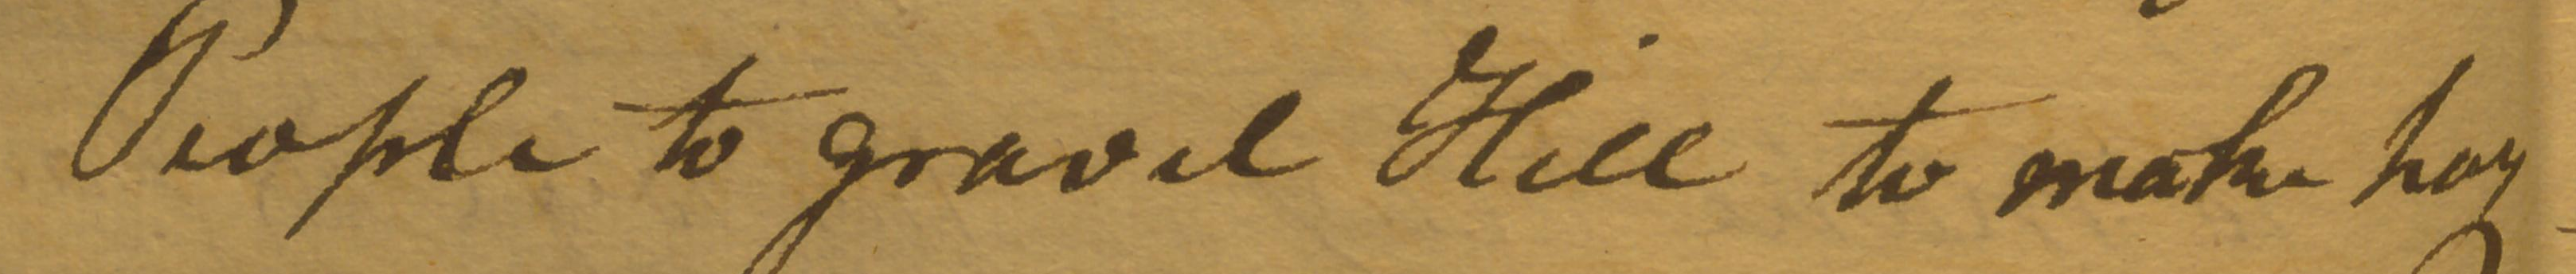People to gravel Hill to make hay
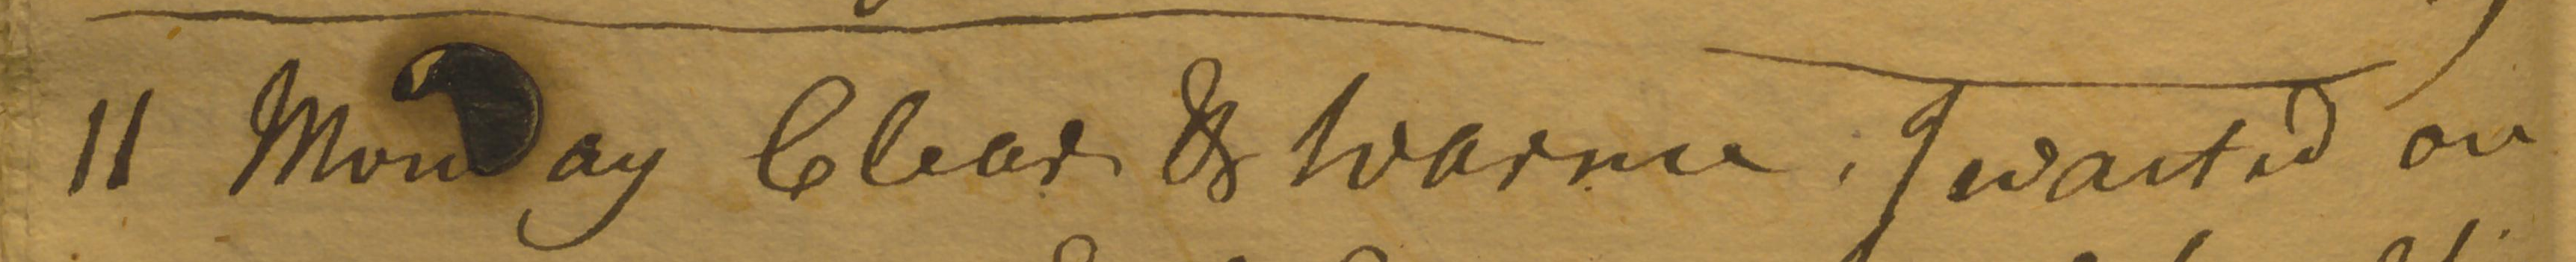11 Monday Clear & warme, I waited on
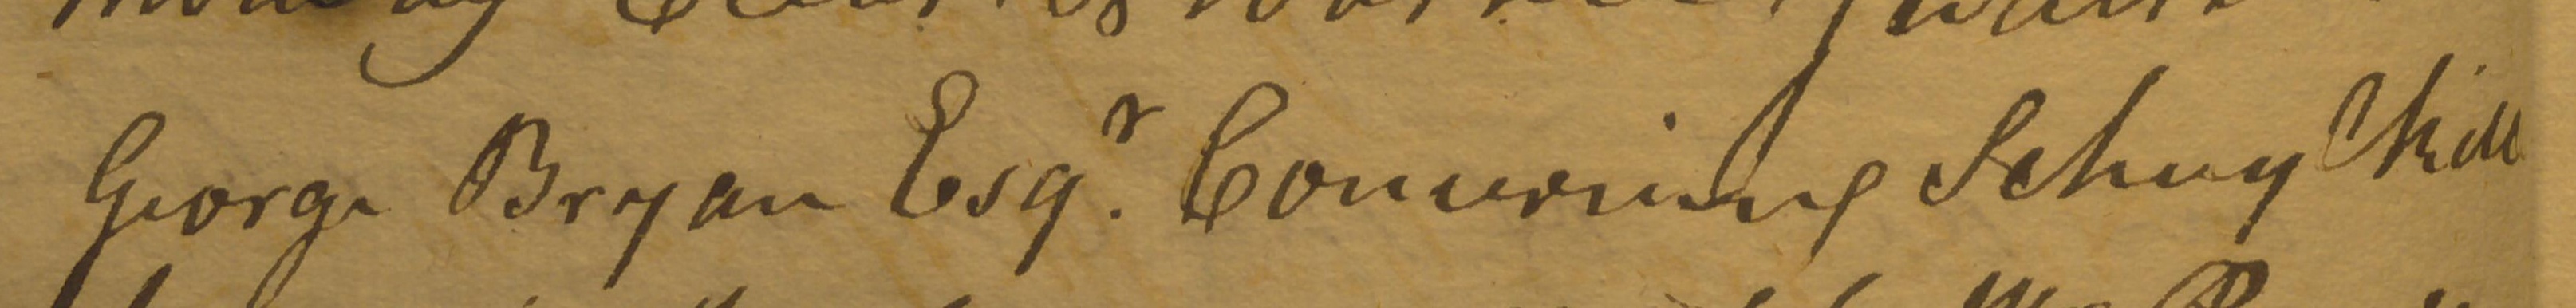George Bryan Esq^r. Concering Schuylkill
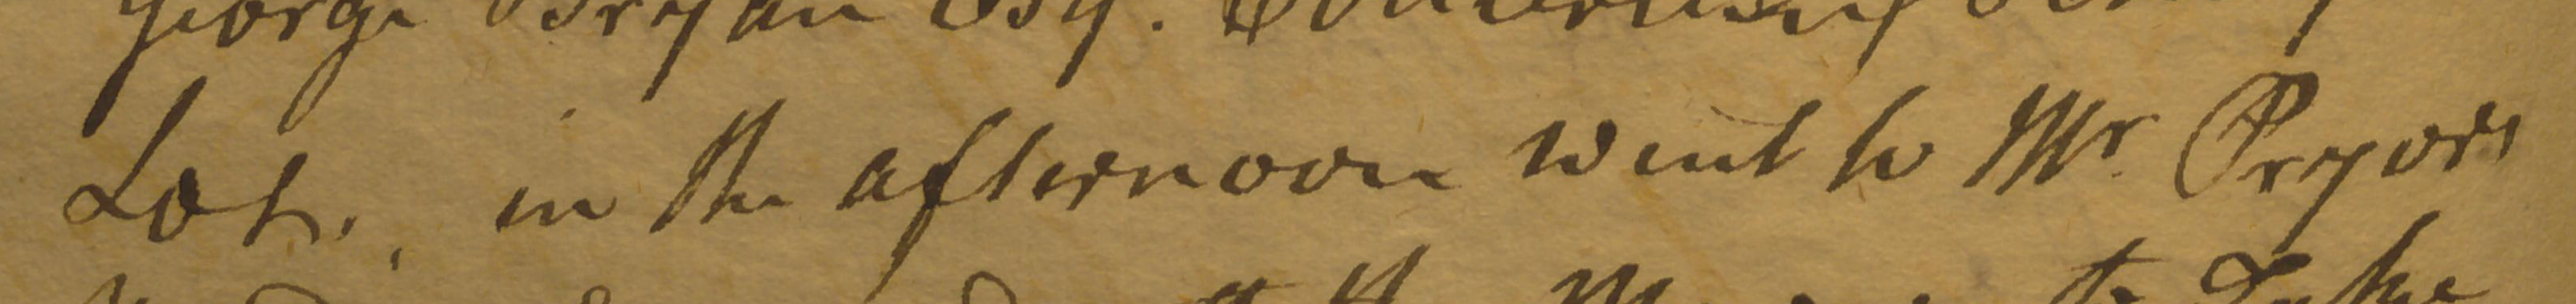Lot, in the afternoon went to M^r. Pryors
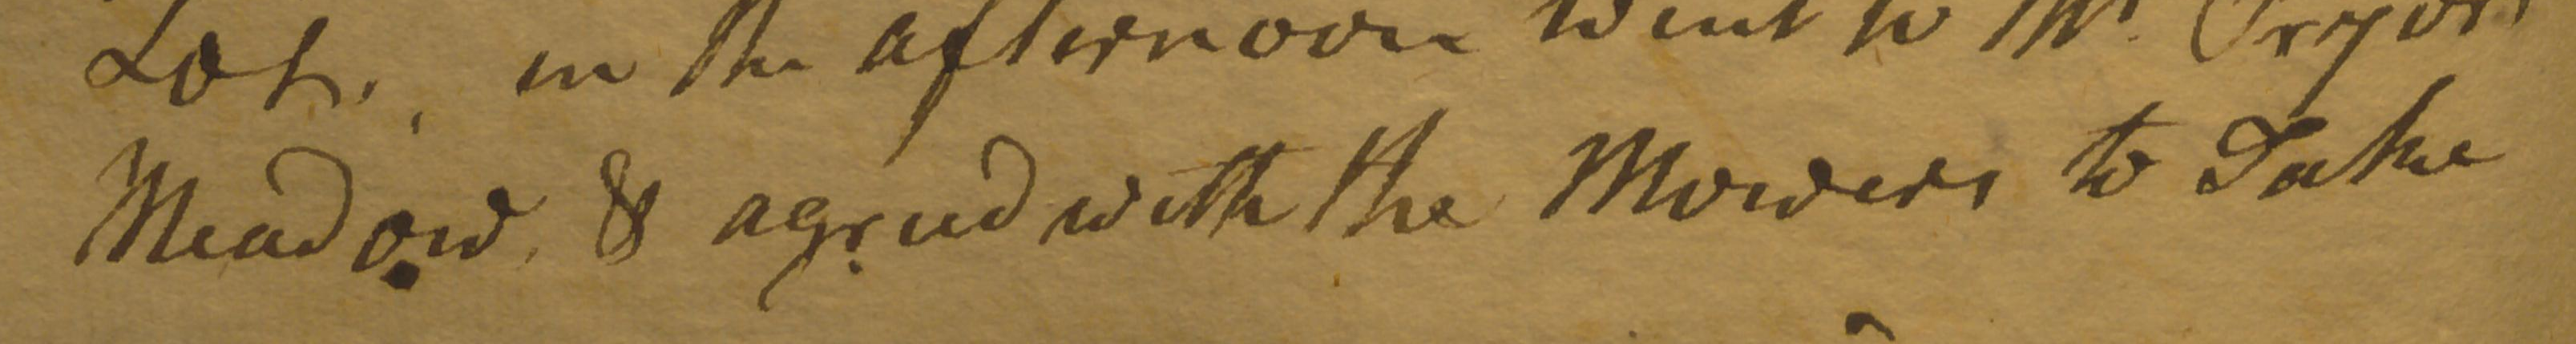Meadow & agreed with the Mowers to Take
